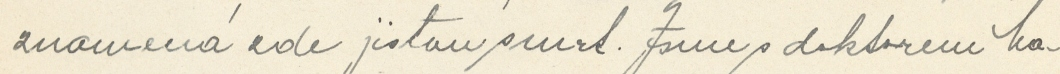znamená zde jistou smrt. Jsme s doktorem Ma-
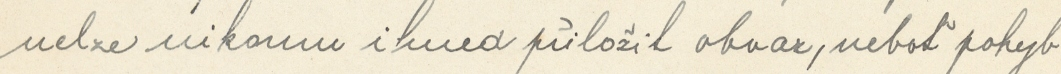nelze nikomu ihned přiložit obvaz, neboť pohyb
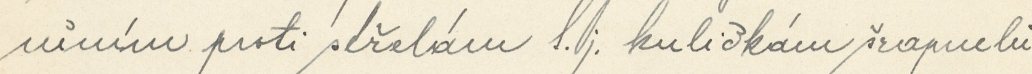něním proti střelám t. j. kuličkám šrapnelů
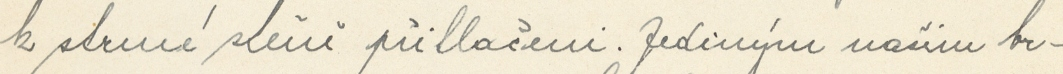k strmé stěně přitlačeni. Jediným našim br-
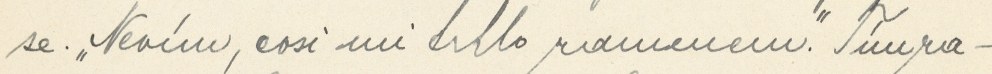se. „Nevím, cosi mi trhlo ramenem.” Tím ra-
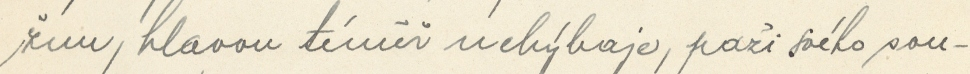žím, hlavou téměř nehýbaje, paži svého sou-
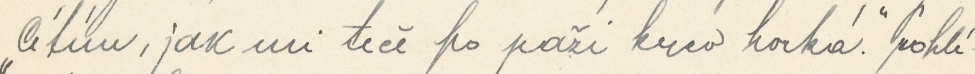„Cítím, jak mi teče po paži krev horká.” Prohlí-
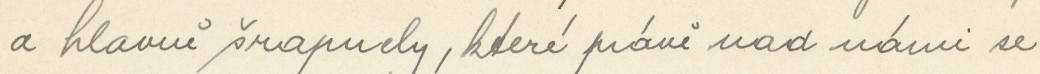a hlavně šrapnely, které právě nad námi se
